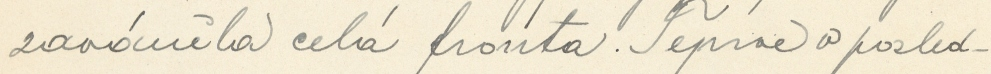zaváněla celá fronta. Teprve v posled-
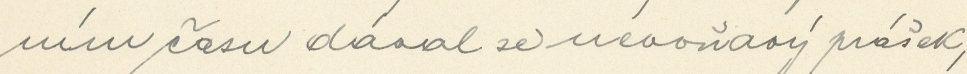ním času dával se nevoňavý prášek,
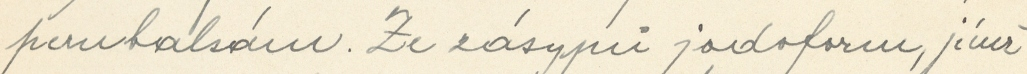perubálsám. Ze zásypů jodoform, jímž
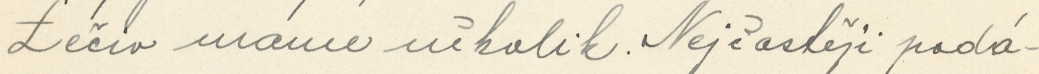Léčiv máme několik. Nejčastěji podá-
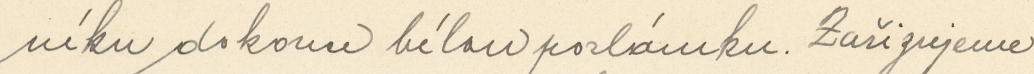níku dokonce bílou poslámku. Zařizujeme
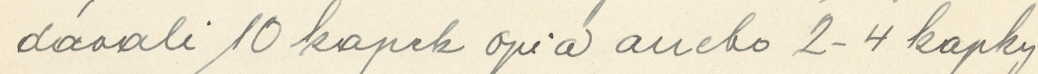dávali 10 kapek opia anebo 2-4 kapky
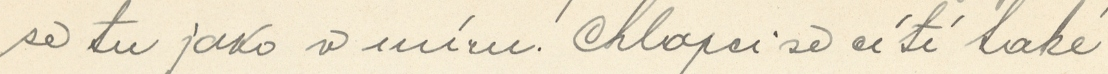se tu jako v míru. Chlapci se cítí také
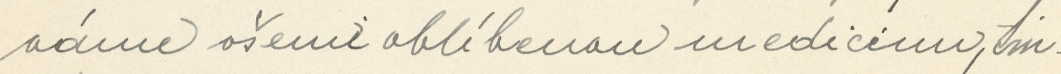váme všemi oblíbenou medicinu, tin-
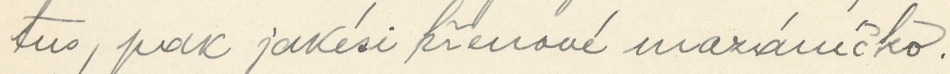tus, pak jakési křenové mazáníčko.
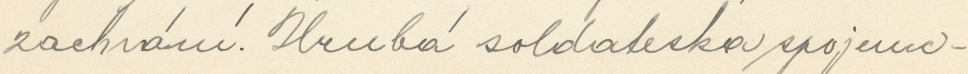zachrání. Hrubá soldateska spojenec-
